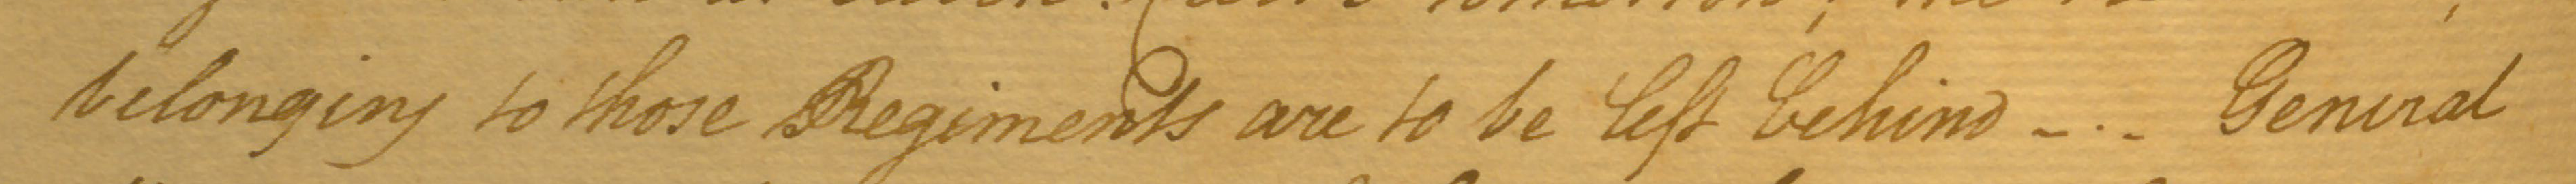belonging to those Regiments are to be left behind-.- General
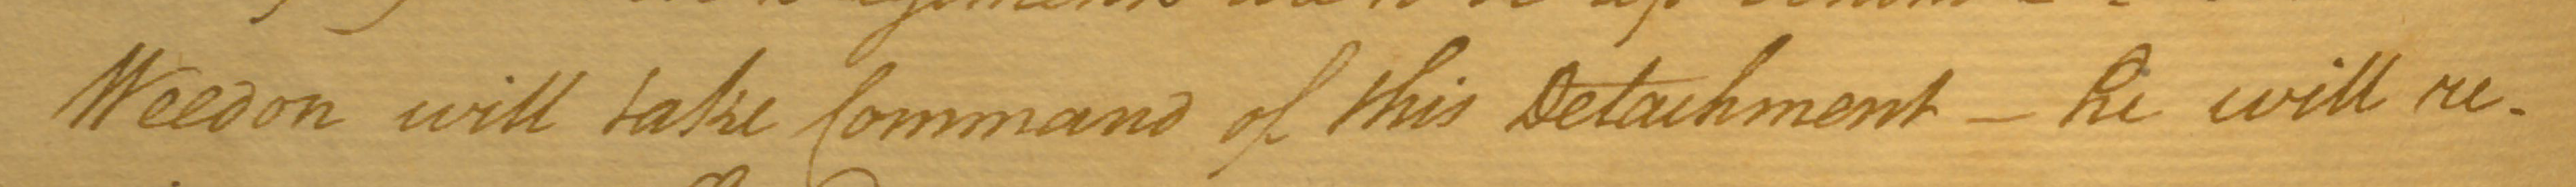Weedon will take Command of this Detachment- he will re-
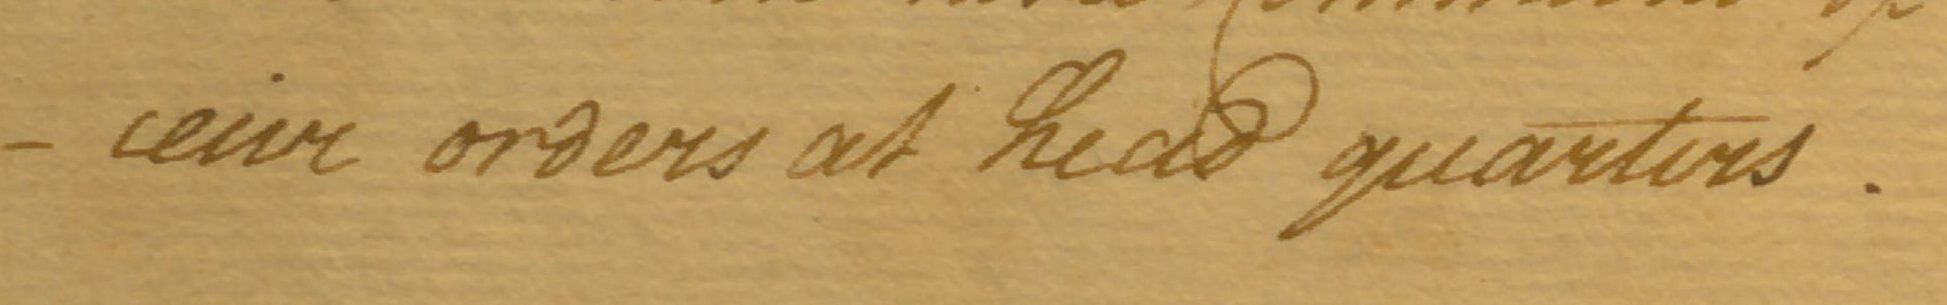-ceive orders at head quarters.
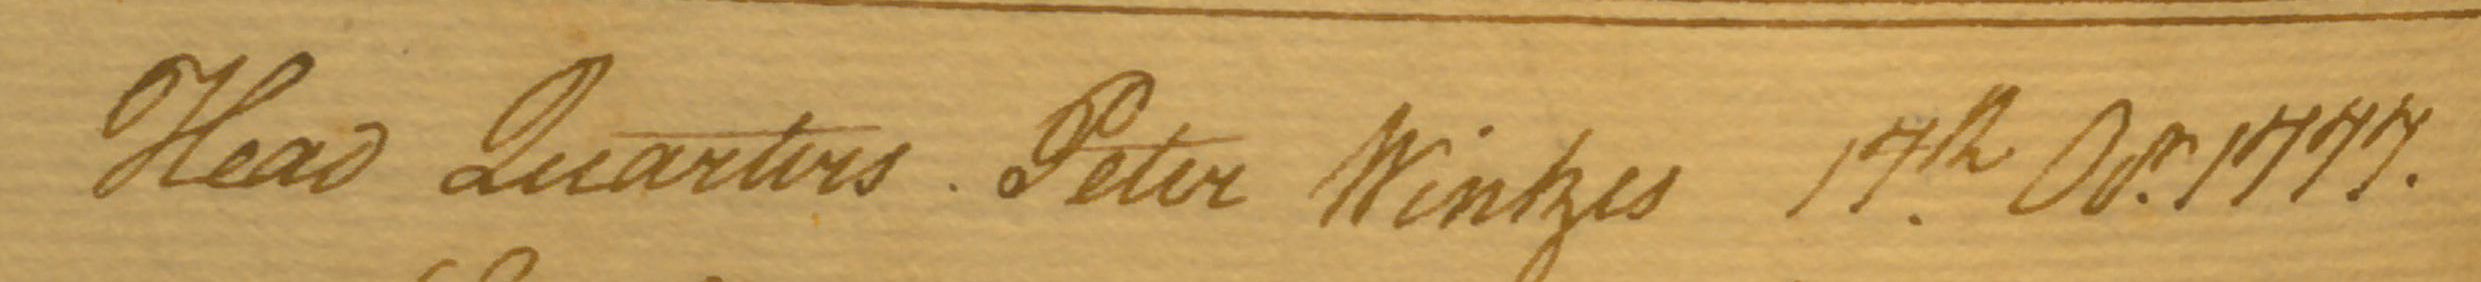Head Quarters. Peter Wintzes 17^th. Oc^r. 1777.
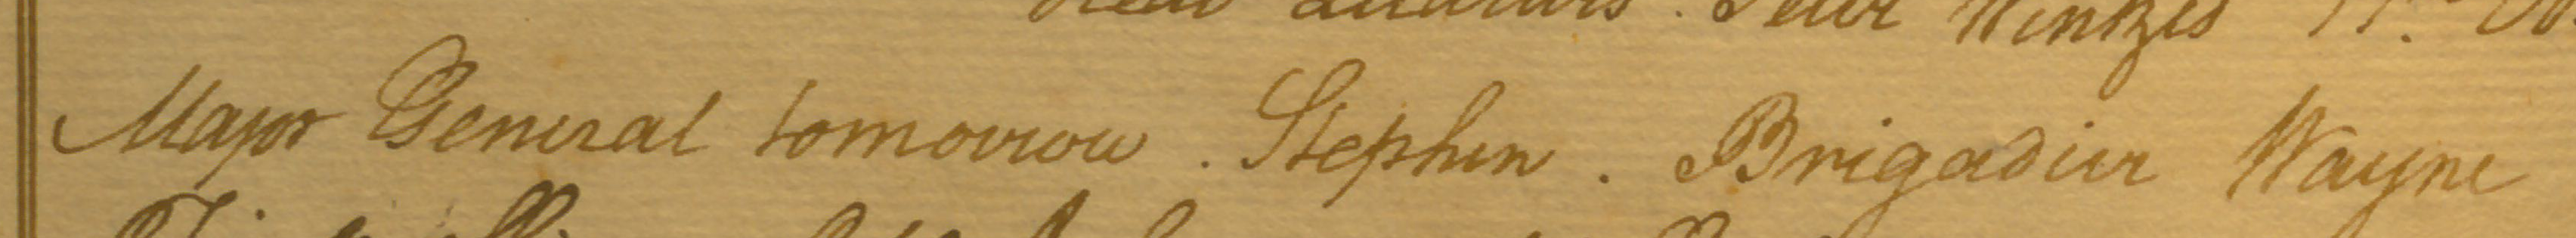Major General tomorrow. Stephen. Brigadier Wayne
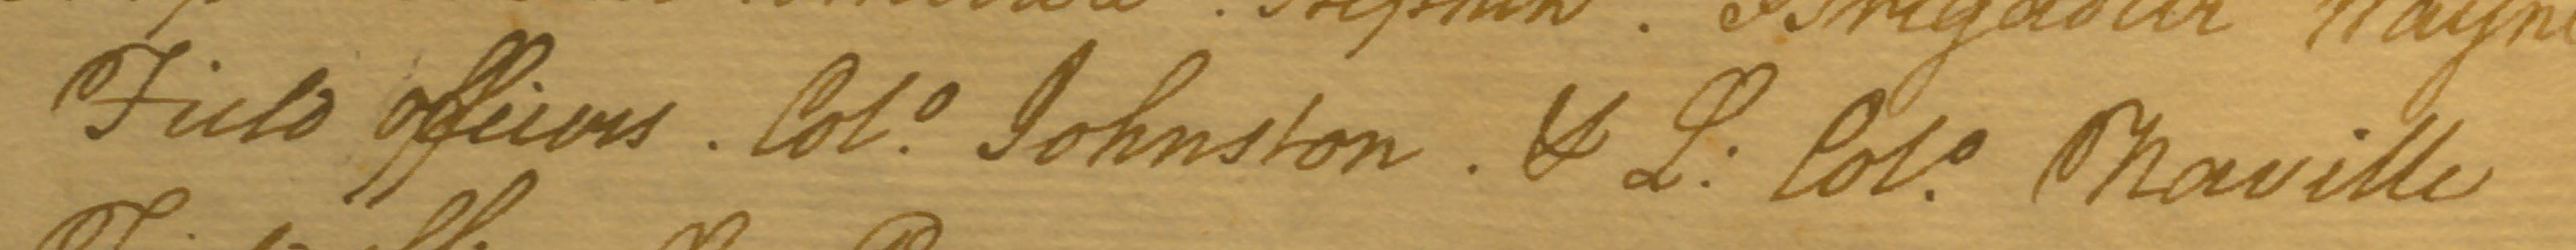Field officers. Col^o. Johnston. & L: Col^o. Naville
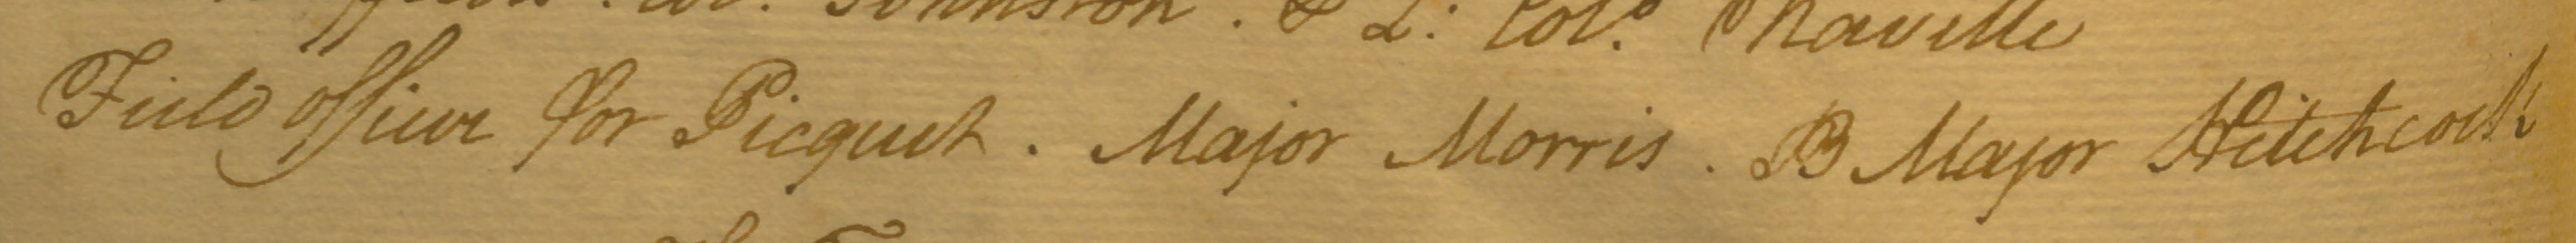Field officer for Picquet. Major Morris. B Major Hitchcock
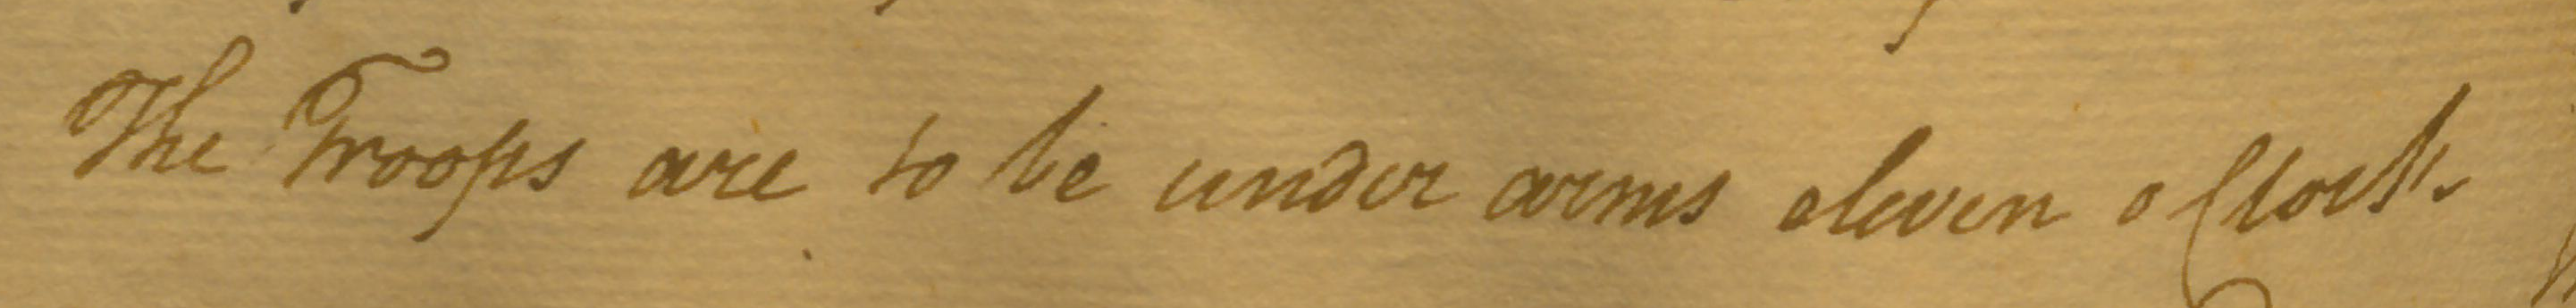The Troops are to e under arms eleven oClock
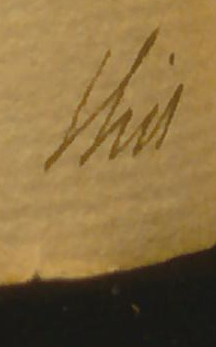this
